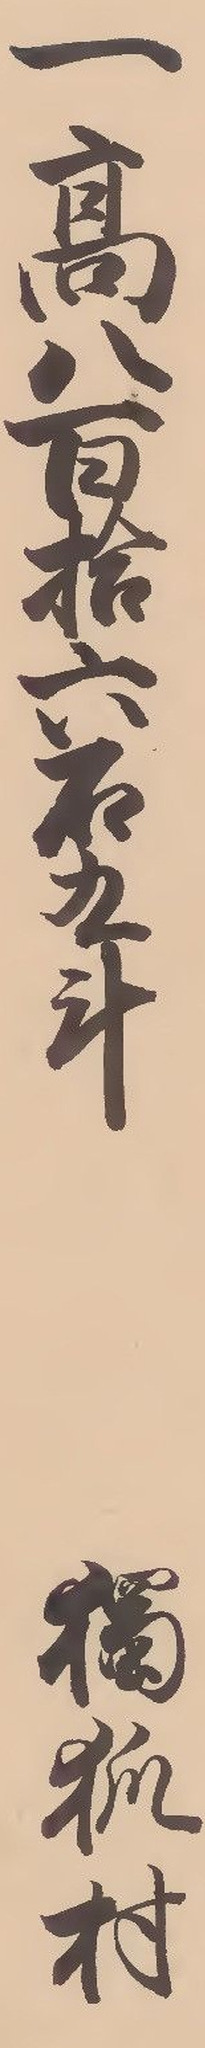一高八百拾六石九斗独狐村

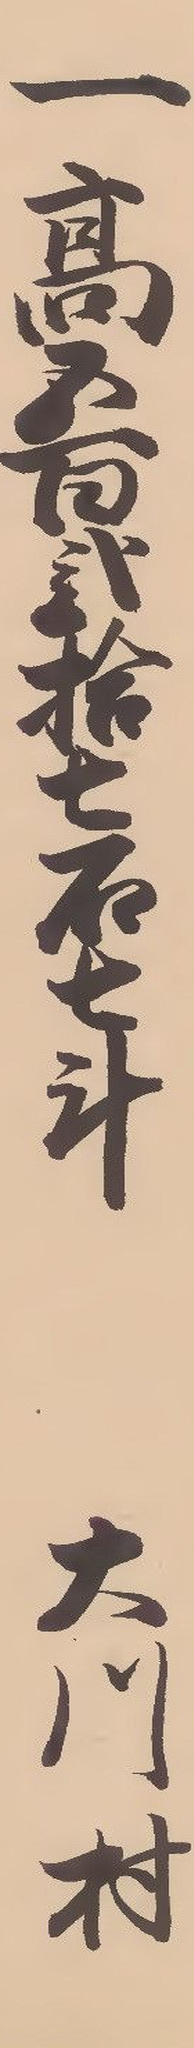一高五百弐拾七石七斗大川村
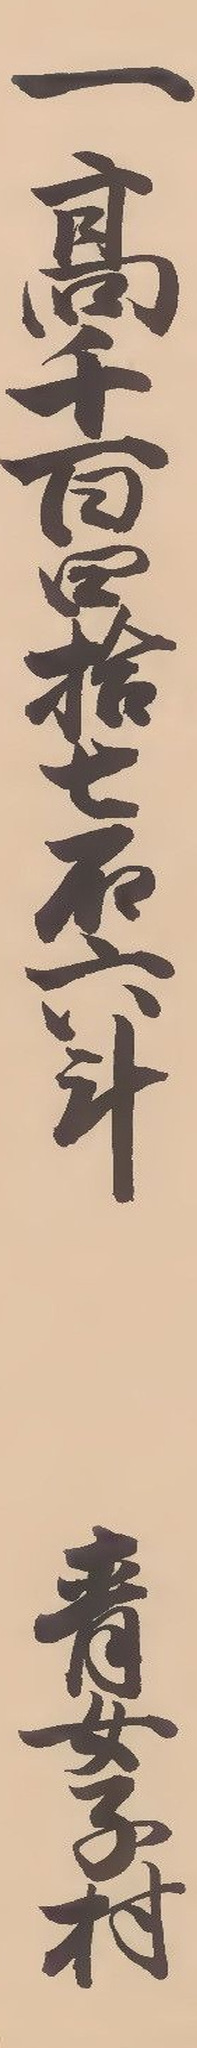一高千百四拾七石六斗青女子村
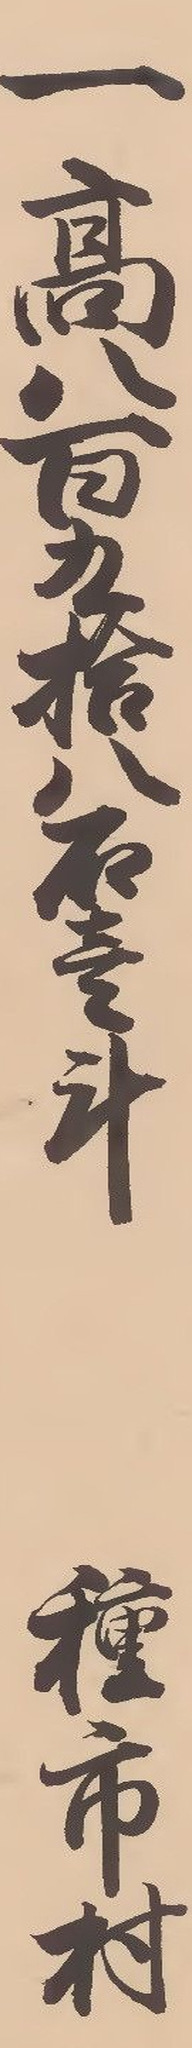一高八百九拾八石壱斗種市村
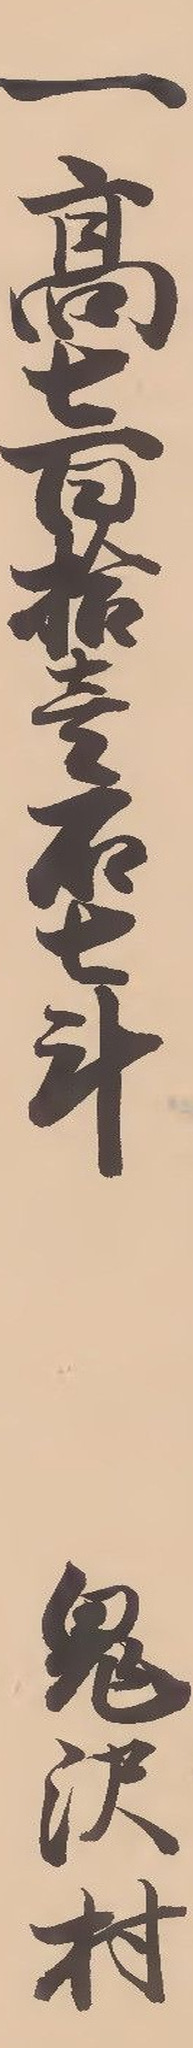一高七百拾壱石七斗鬼沢村

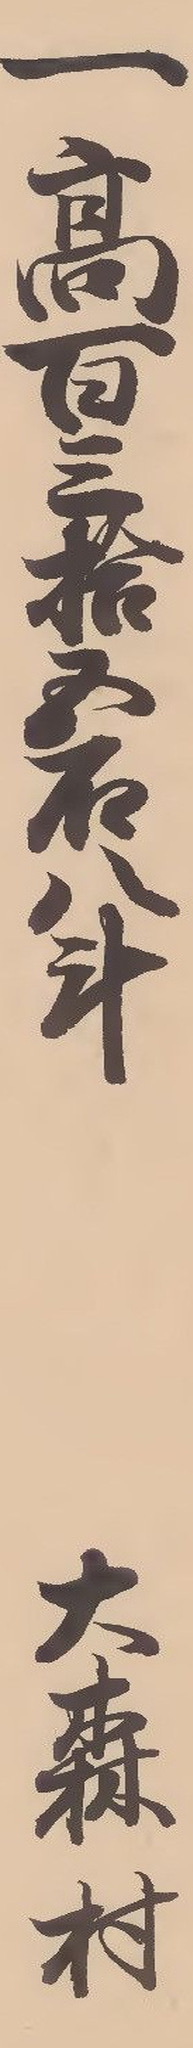一高百三拾五石八斗大森村
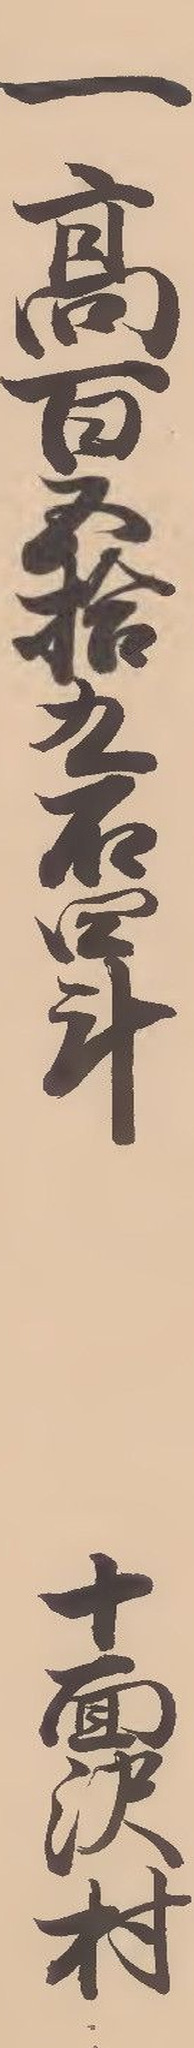一高百五拾九石四斗十面沢村
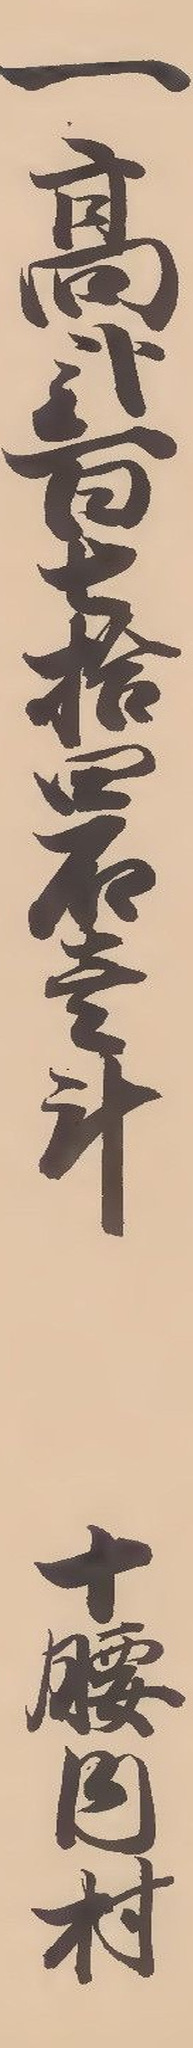一高弐百七拾四石壱斗十腰内村
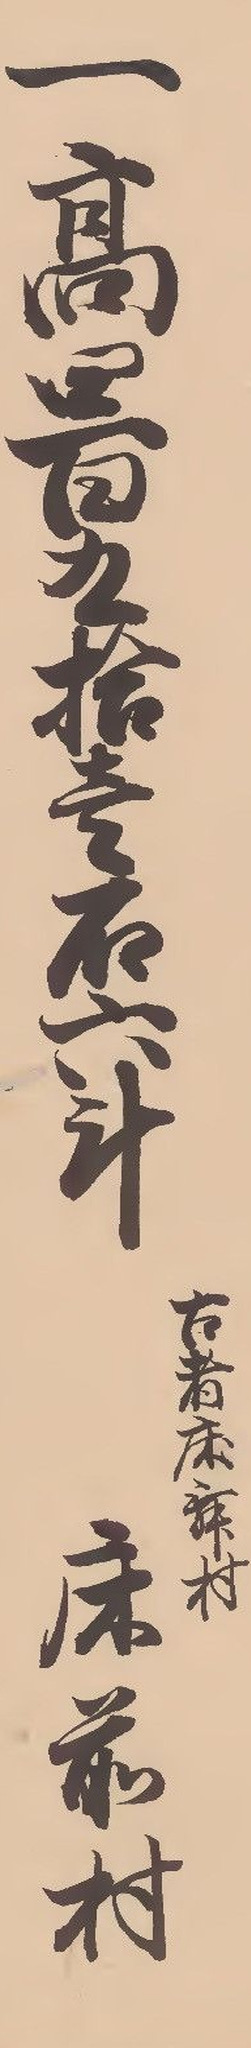一高四百九拾壱石六斗床前村
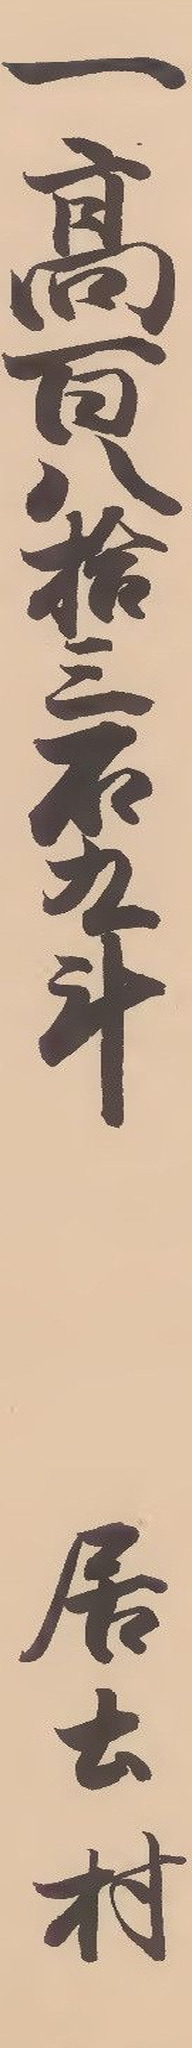一高百八拾三石九斗居土村
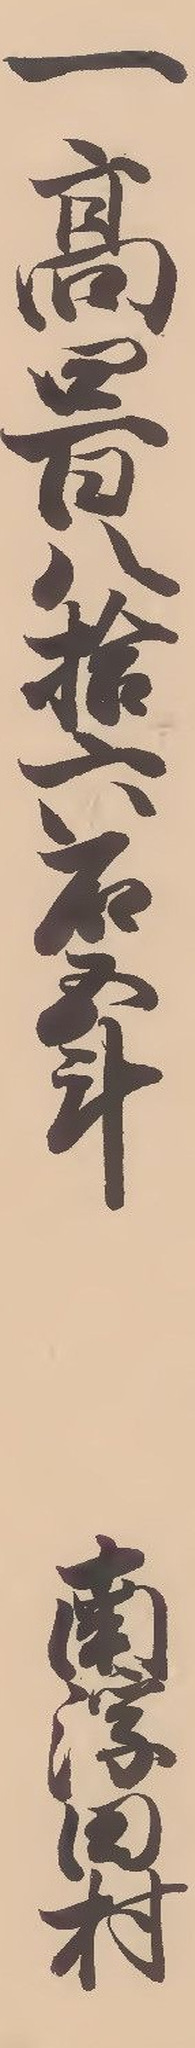一高四百八拾六石五斗南浮田村

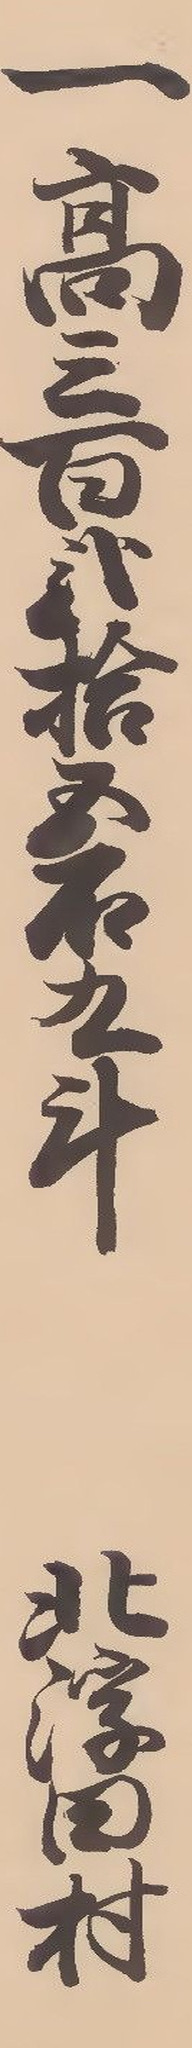一高三百弐拾五石九斗北浮田村
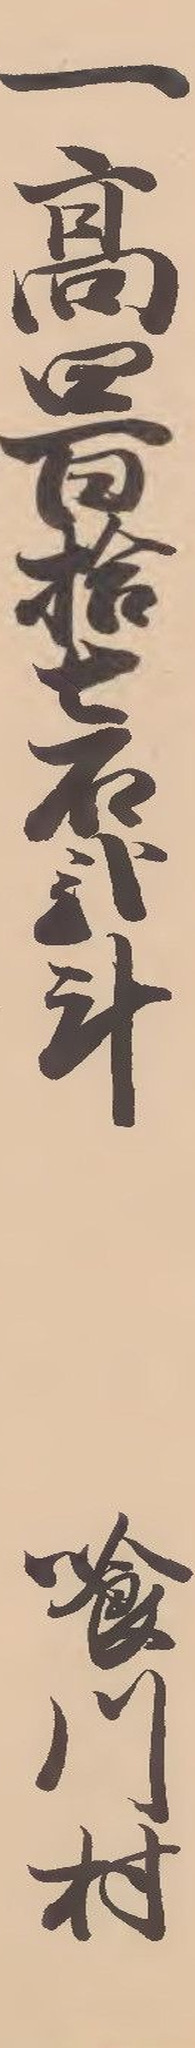一高四百拾七石弐斗喰川村
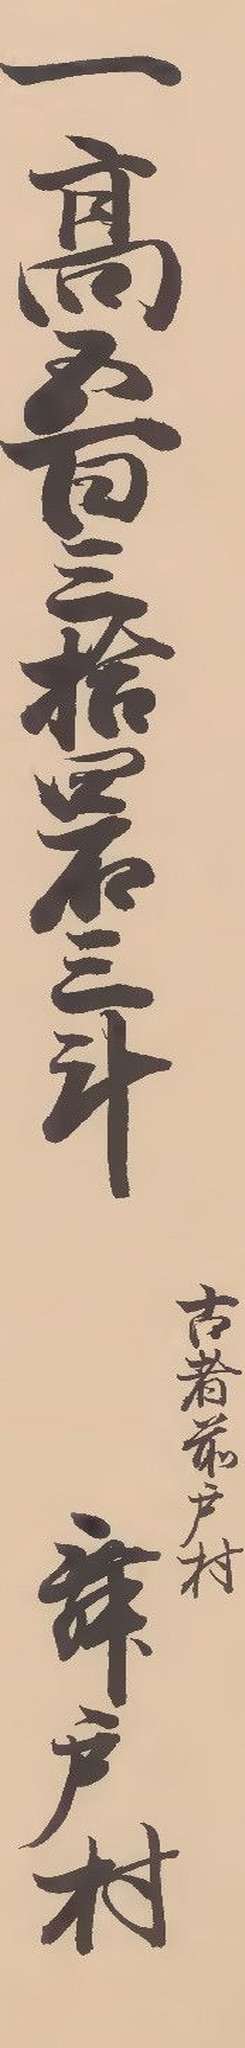一高五百三拾四石三斗舞戸村
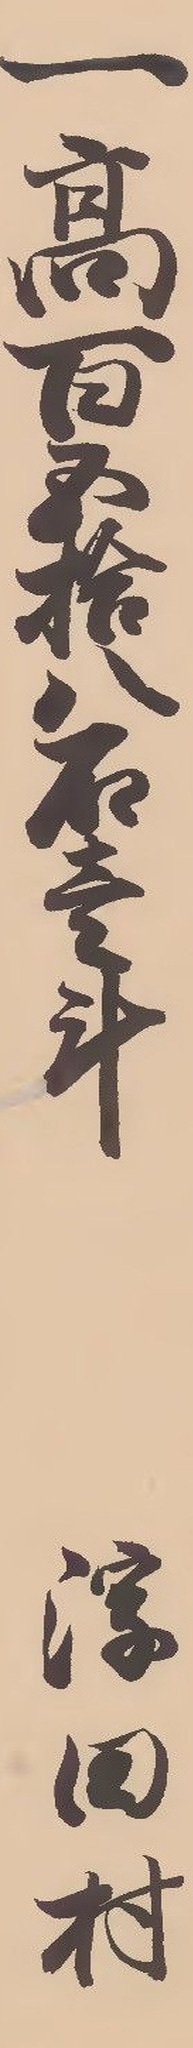一高百五拾八石壱斗浮田村
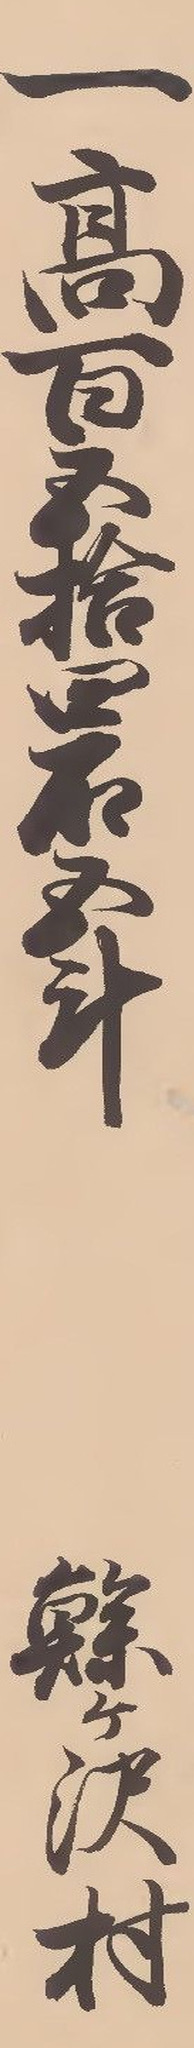一高百五拾四石五斗鯵ヶ沢村
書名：陸奥国郷帳　７
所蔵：国立公文書館 National Archives of Japan
